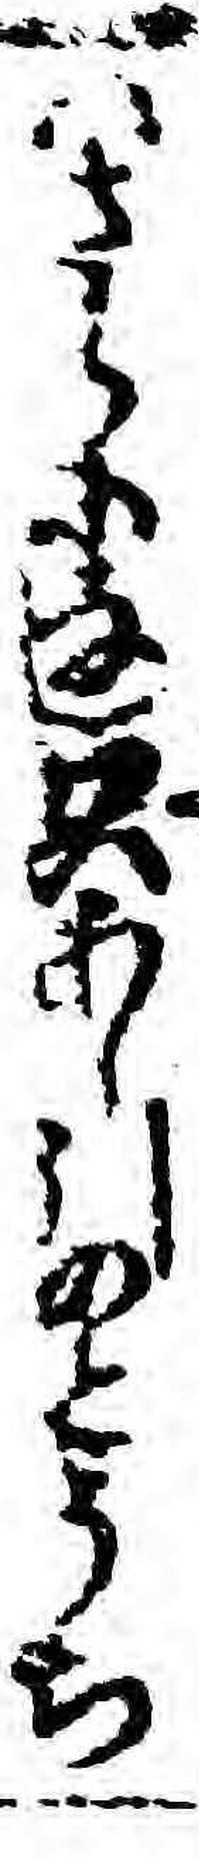はさらになし只あし引のとうち
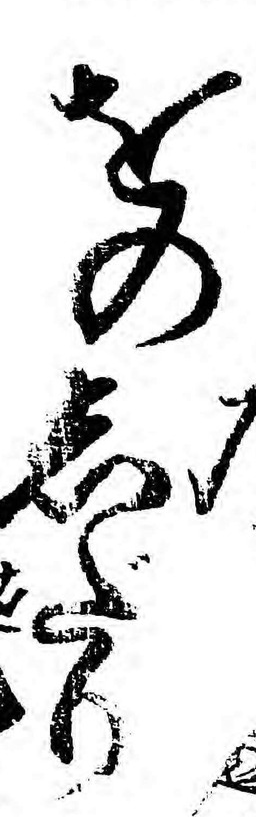をのしだり
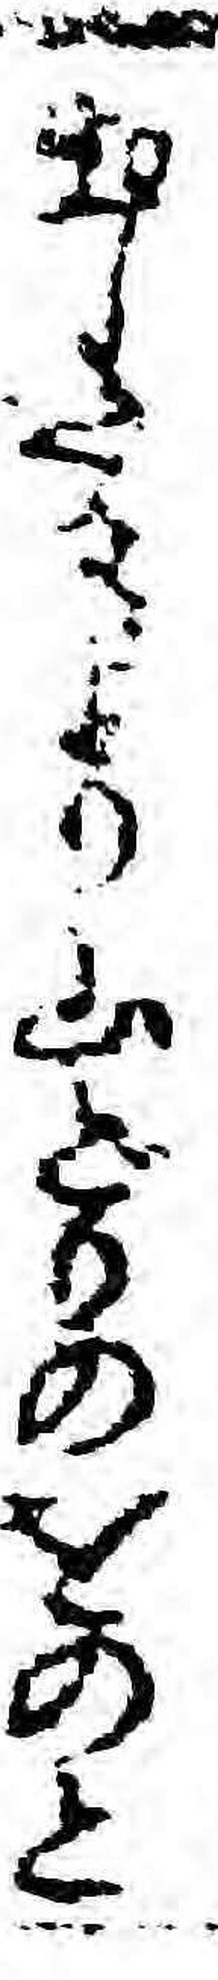出したるにより山どりのをのと
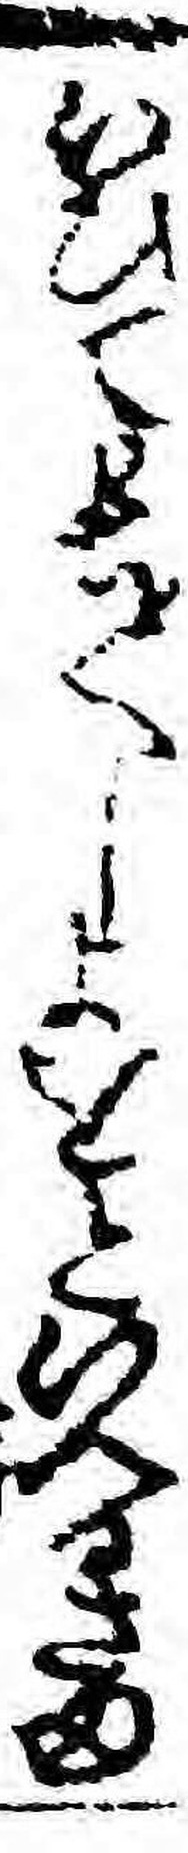いひて長〳〵しよをといへるさま
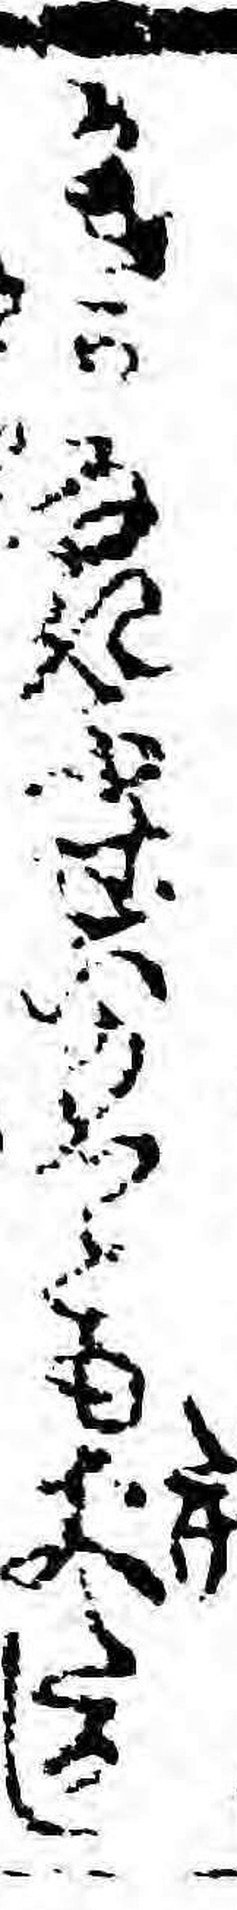かぎりなきふぜいもつとも丈たかし
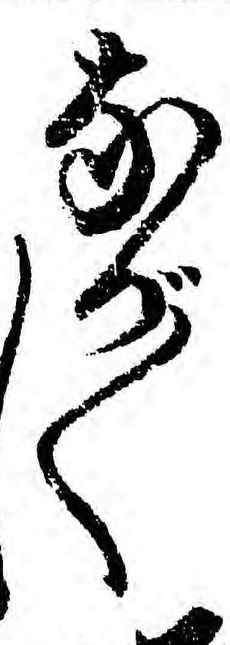なが〳〵
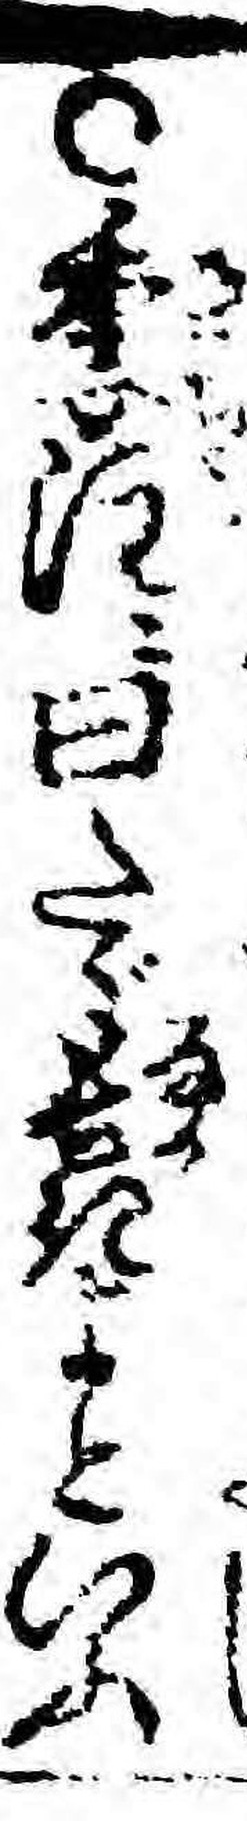〇季注に曰たゞ長きよといふ
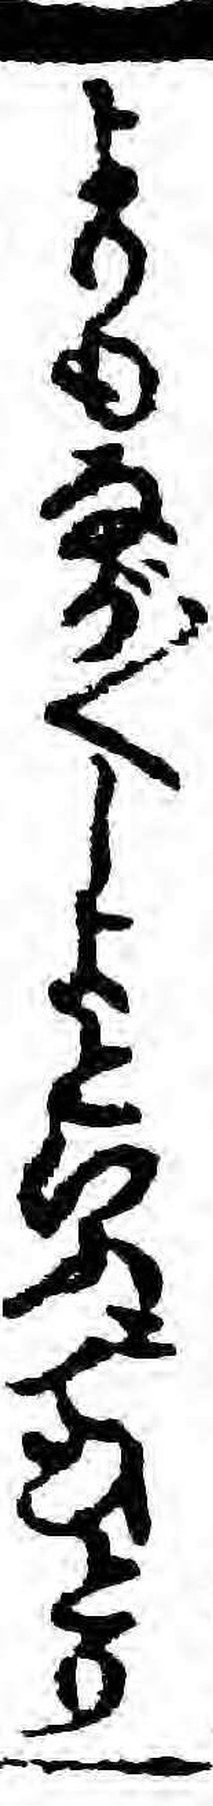よりもなが〳〵しよといふにてひとり
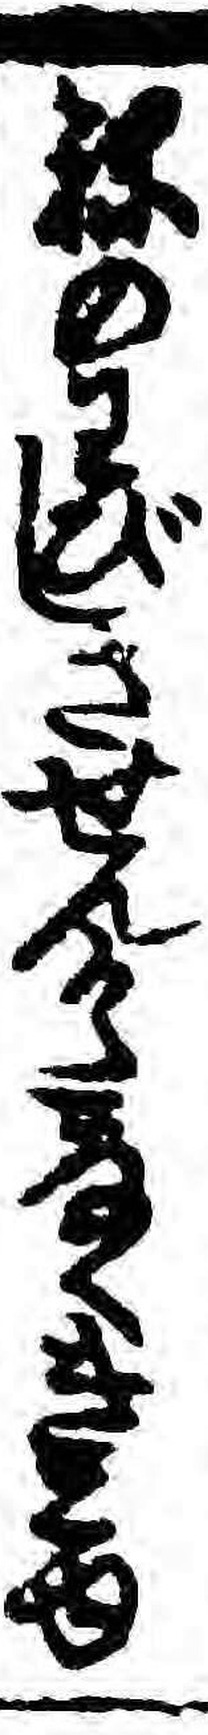ねのわびしさせんかたなくきこゆ

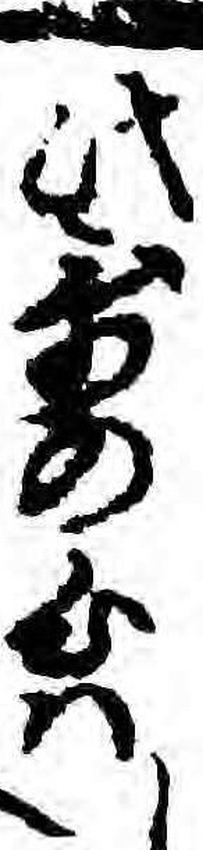此哥の心は
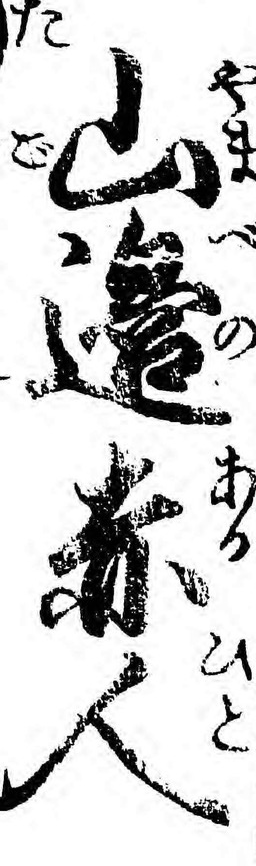山辺赤人
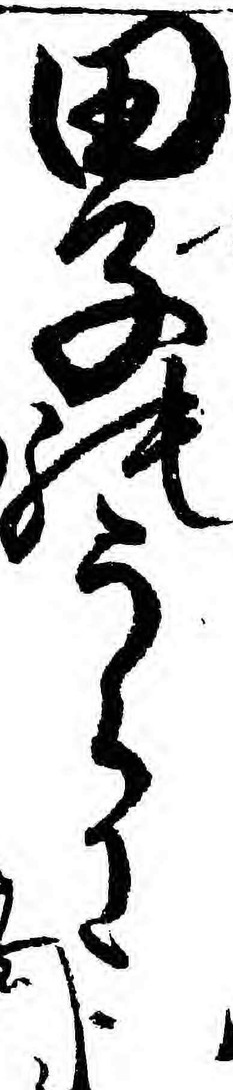田子のうらに
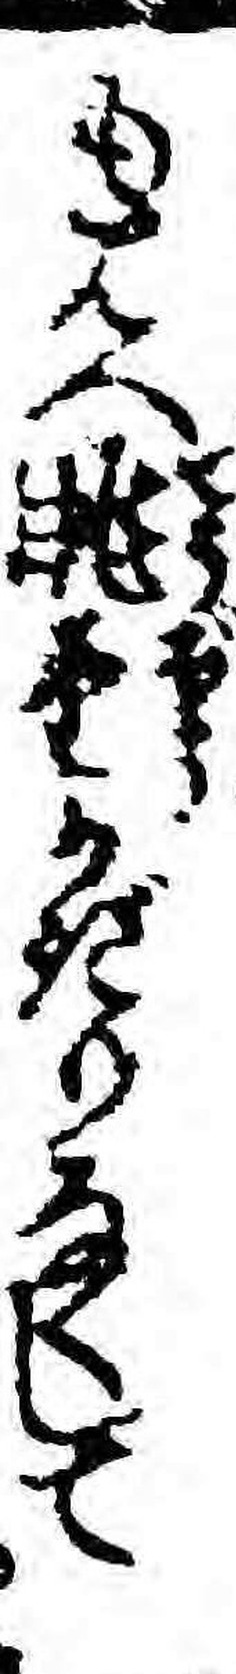もはへ眺望かぎりなくして
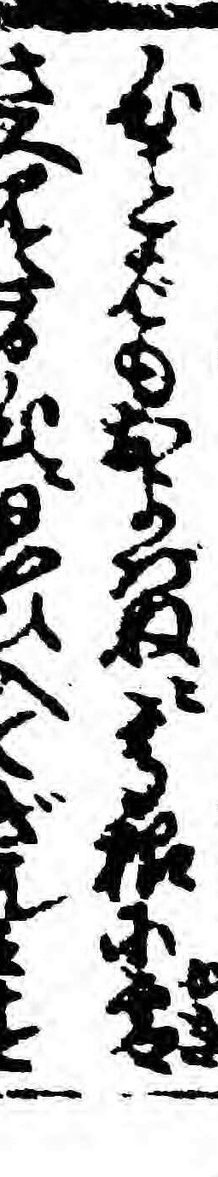心ことばもおよばぬに高根に雪
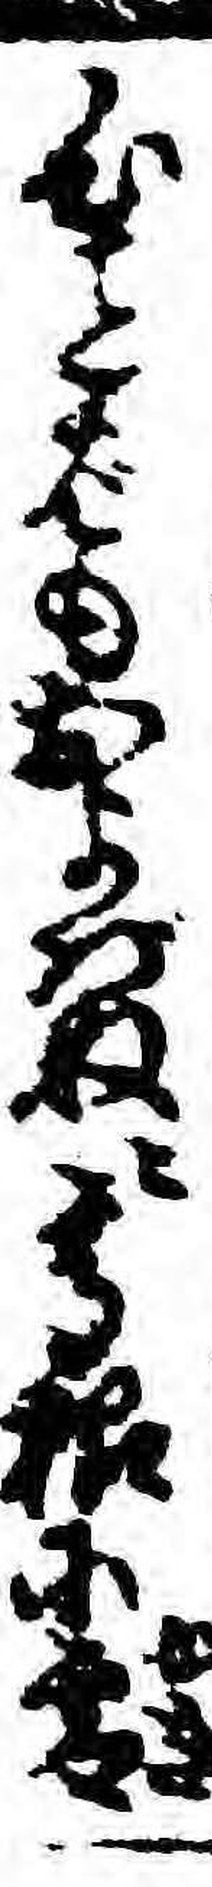心ことばもおよばぬに高根に雪
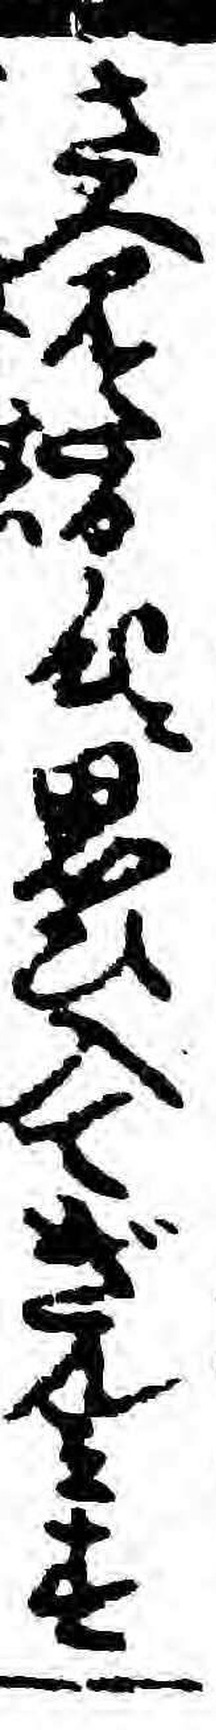さへ見たる心に思ひ入てぎんみす
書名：頭書和歌注譯／壽賀多百人一首小倉錦
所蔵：国文学研究資料館
